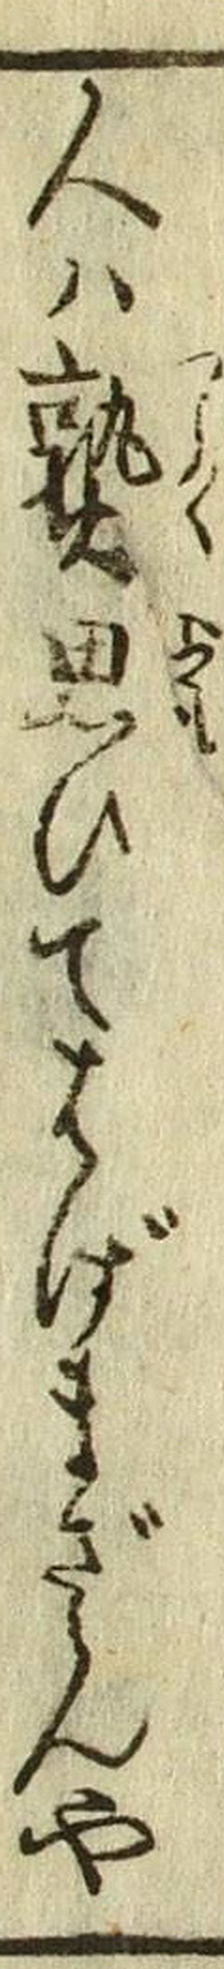人は熟思ひてはげまざらんや
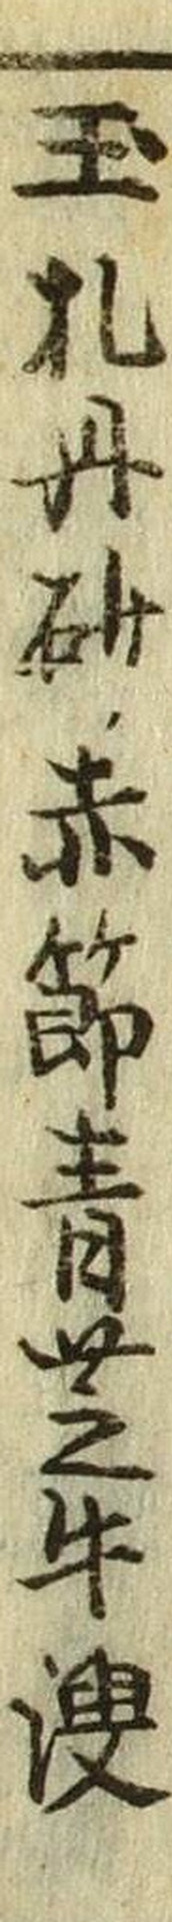玉札丹砂赤節青芝牛溲

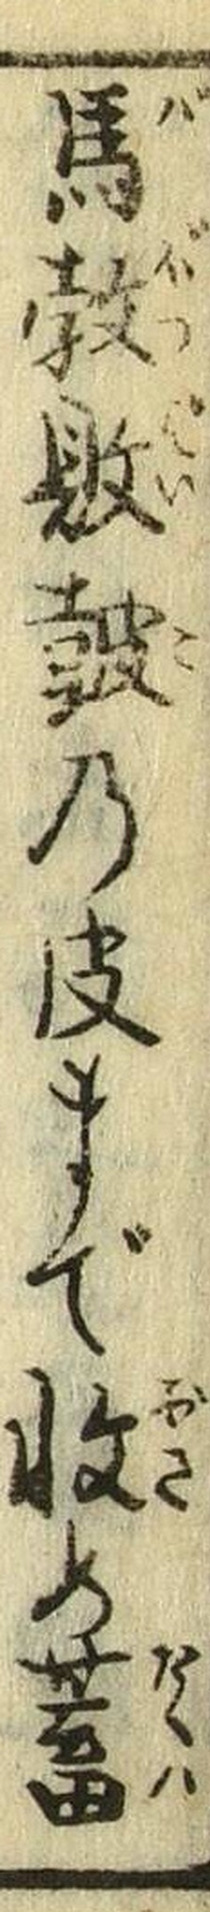馬㪍敗鼓の皮まで收め蓄
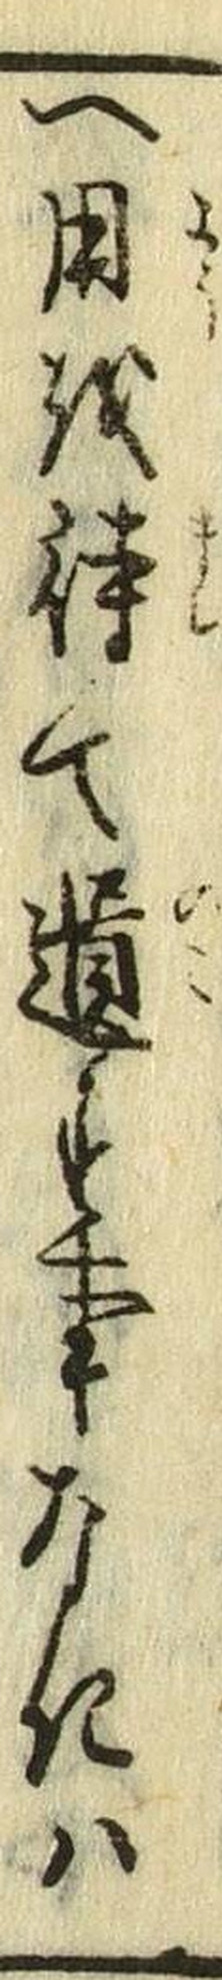へ用を待て遺す事なきは
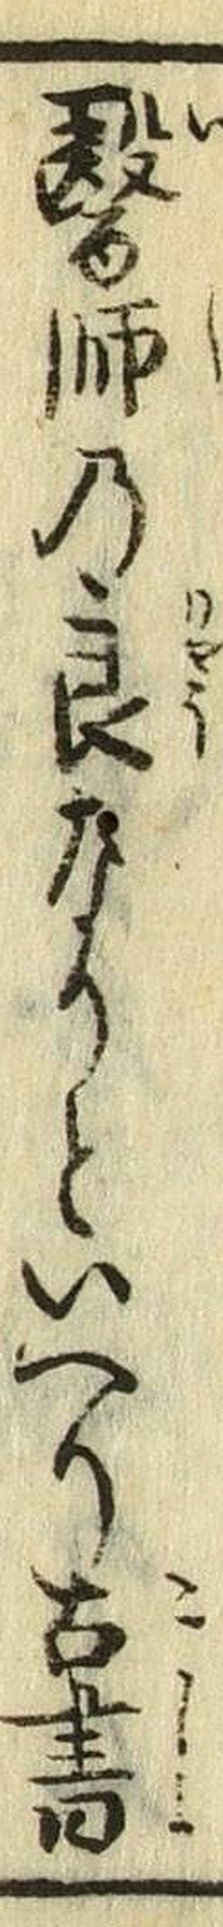医師の良なりといへり古書
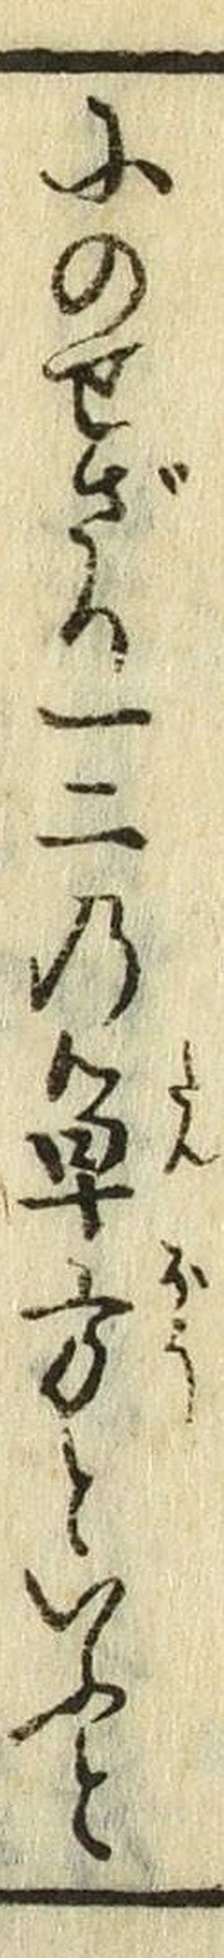にのせざる一二の単方といふと
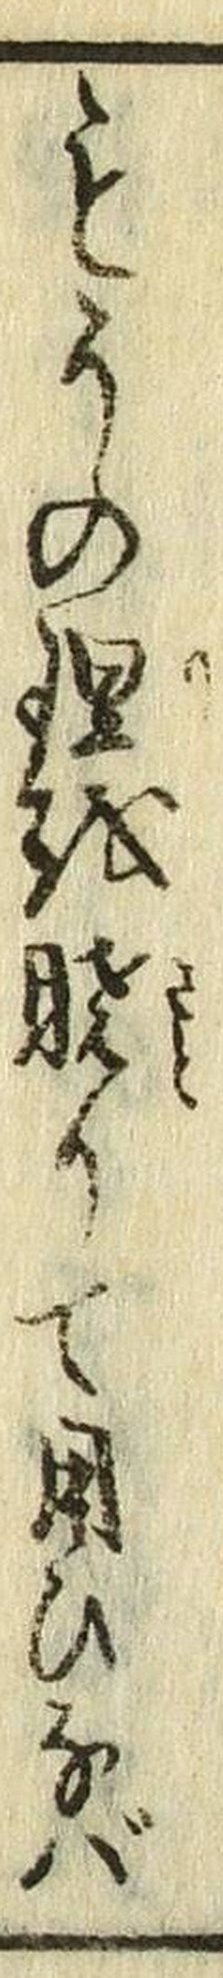もその理を暁りて用ひなば
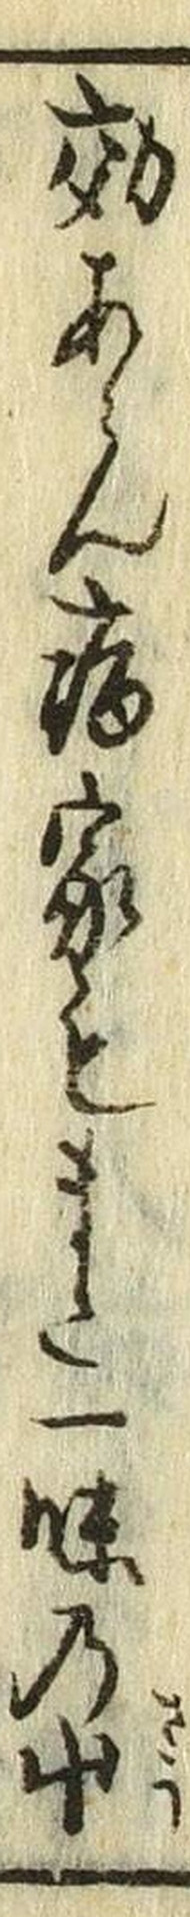効あらん病家もまた一味の草
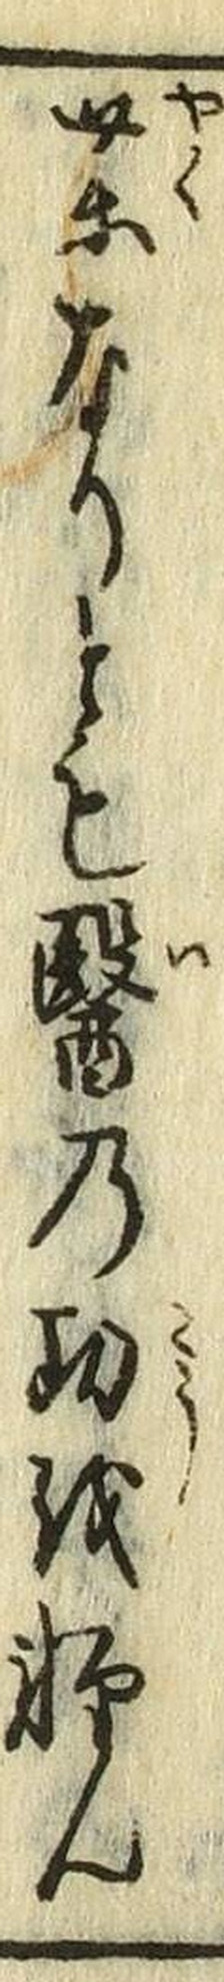薬なりとも医の功を軽ん
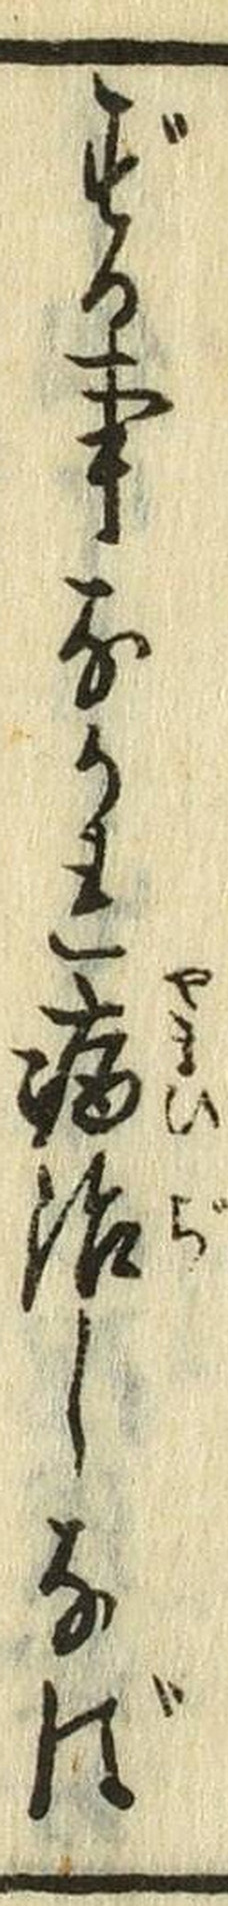ずる事なかれ病治しなば
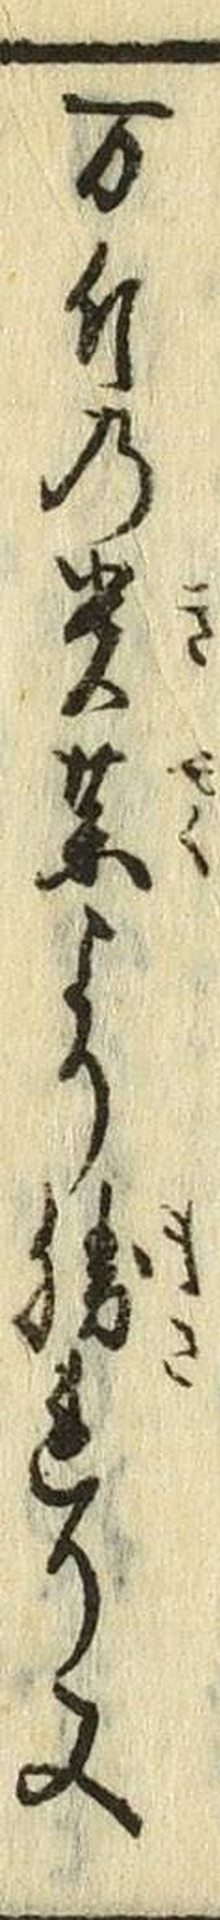万斤の貴薬より勝れり又
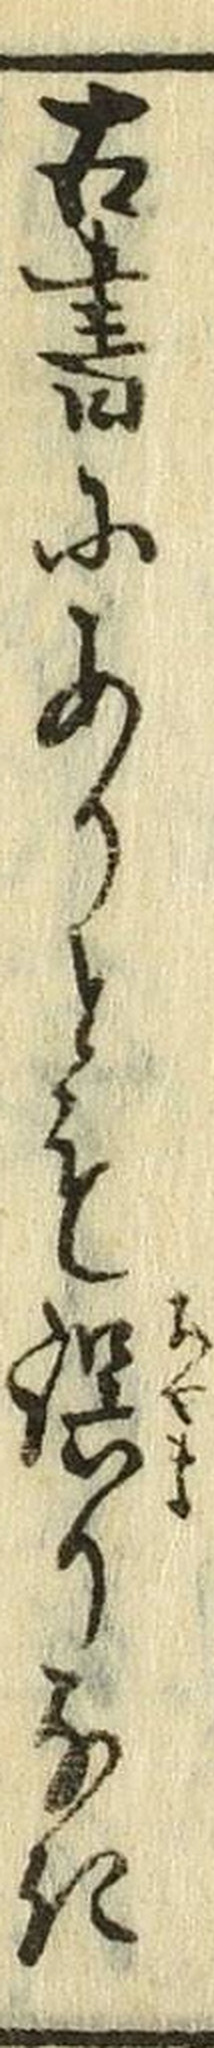古書にありとも誤りなき
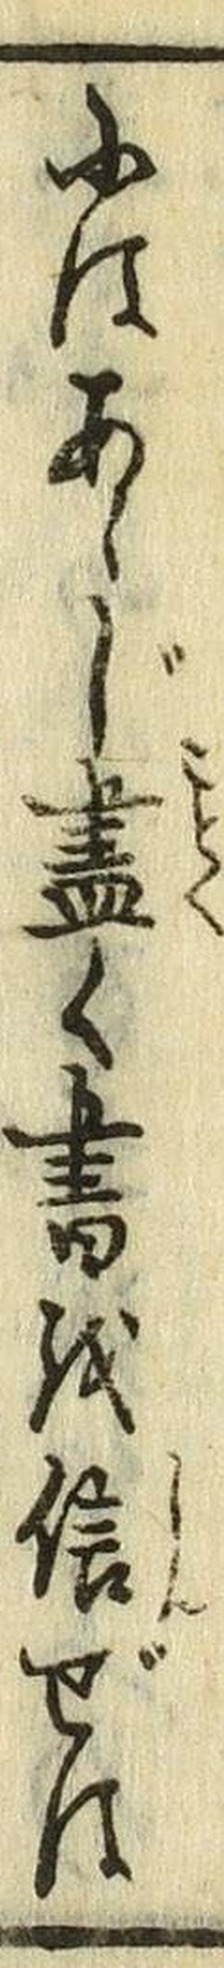にはあらじ尽く書を信ぜは
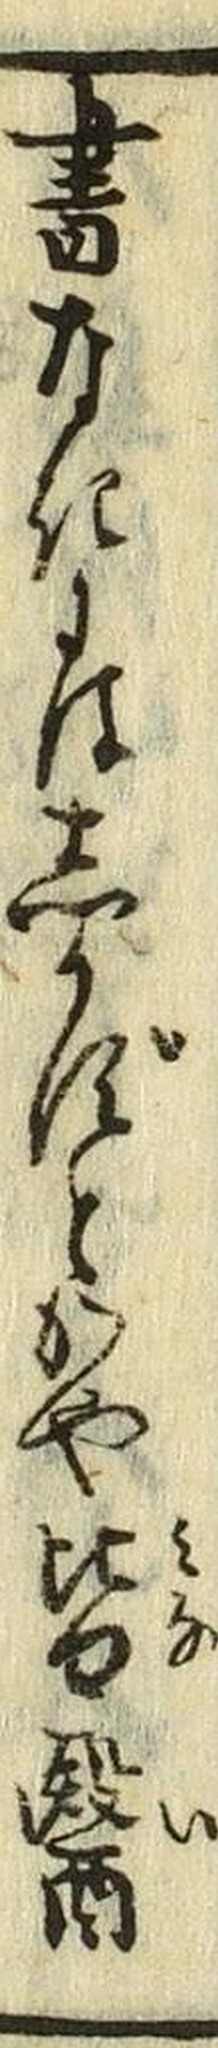書なきにはしかずとかや皆医
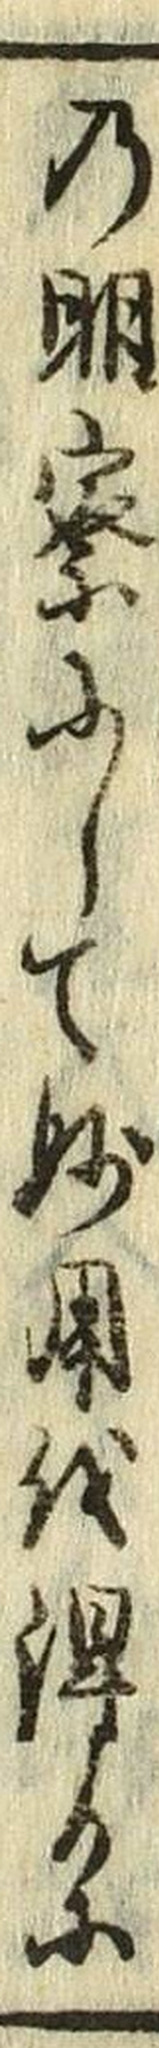の明察にして妙用を得るに
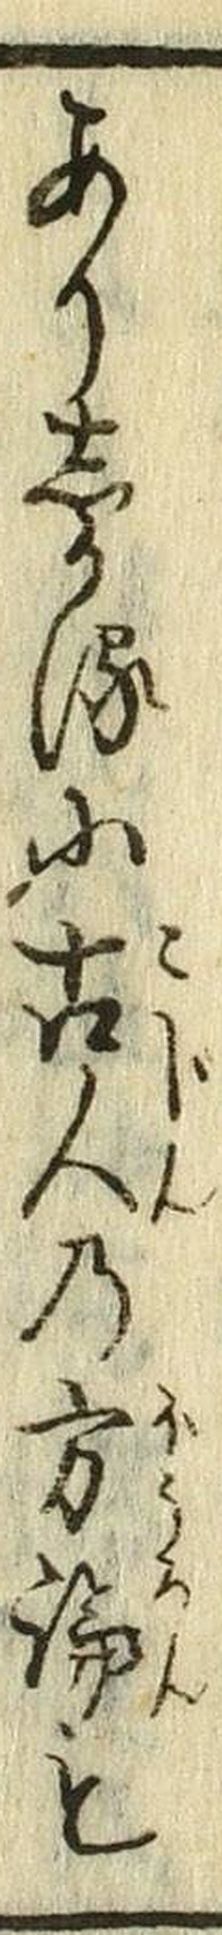ありしかるに古人の方論も
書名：居家養生記
